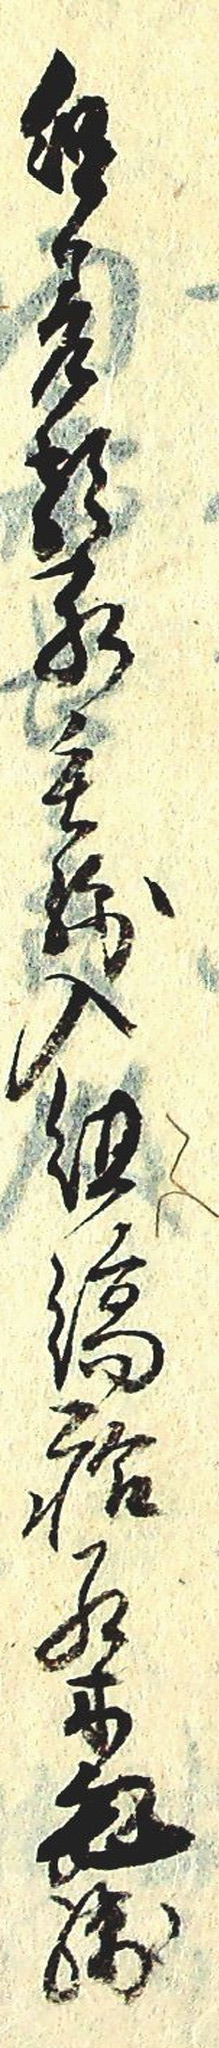但着類紅毛綿入紺縞袷紅木毛綿
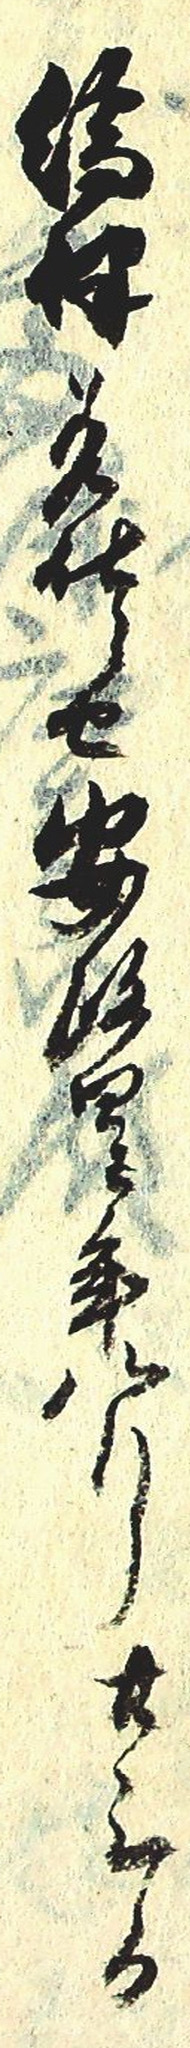襦袢着仕らせ安政四巳年八月廿三日
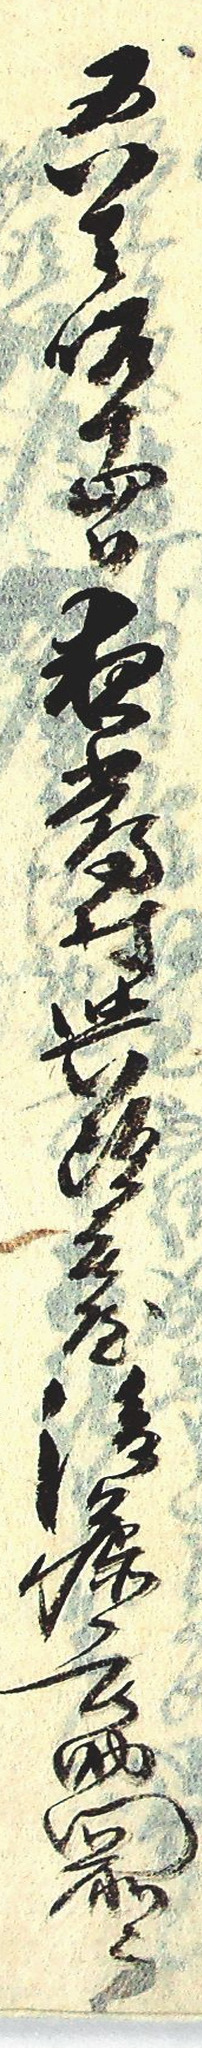右は昨十四日夜当村与頭庄屋後藤庄助門前に

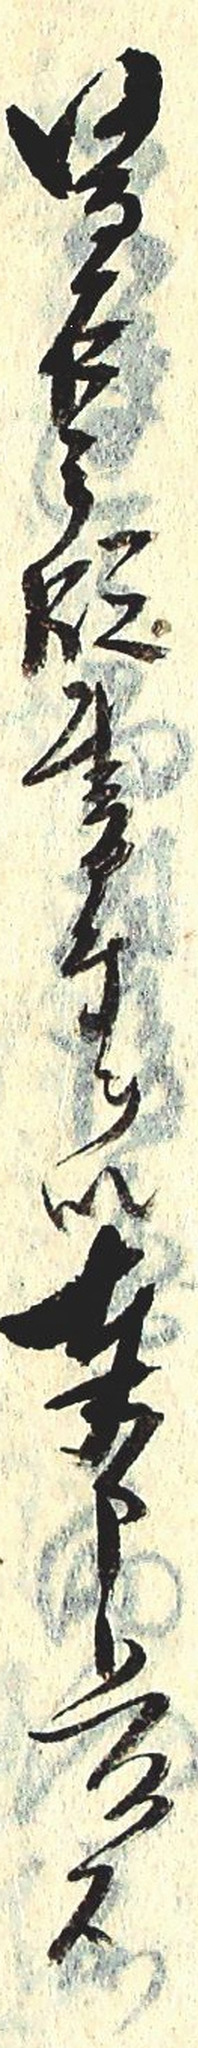仍て右之段書付を以奉申上候以上
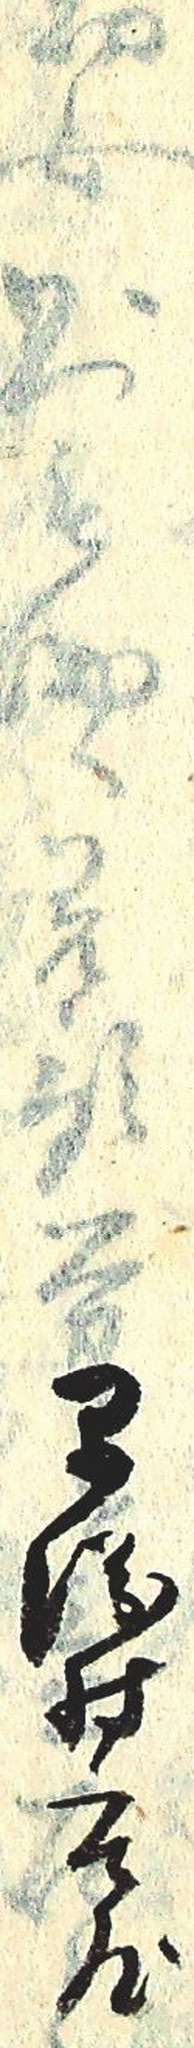早淵村庄屋
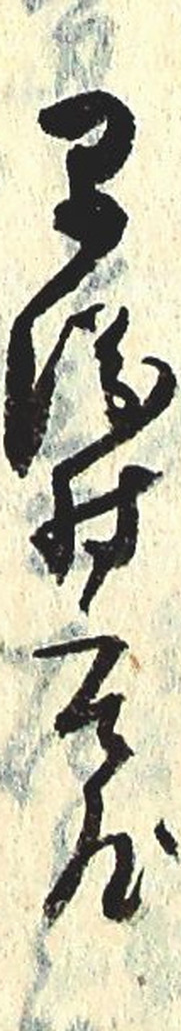早淵村庄屋
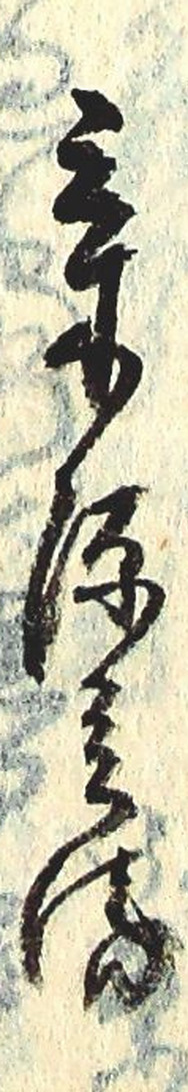三木源兵衛
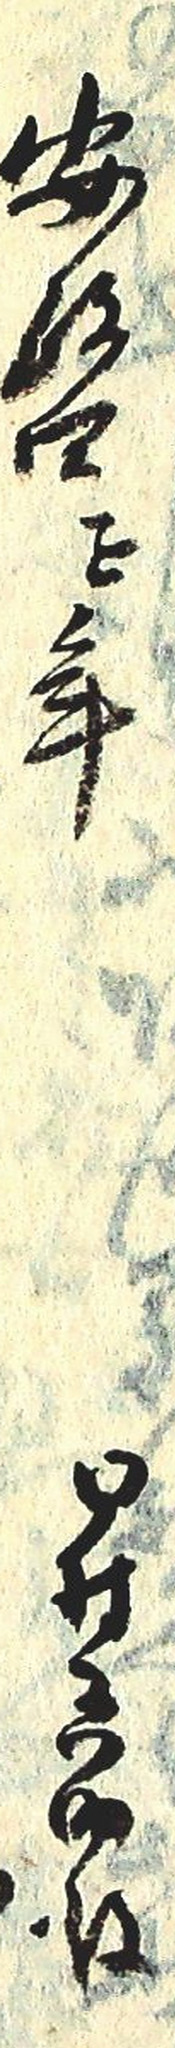安政四巳年同村右助役
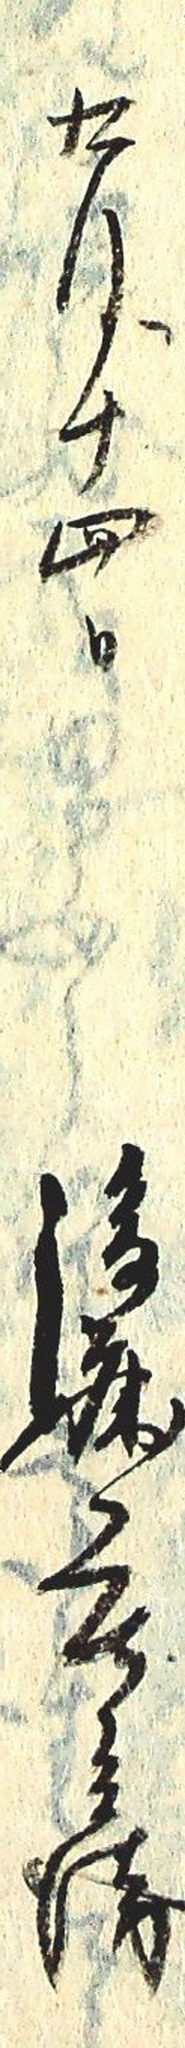九月十四日後藤庄兵衛
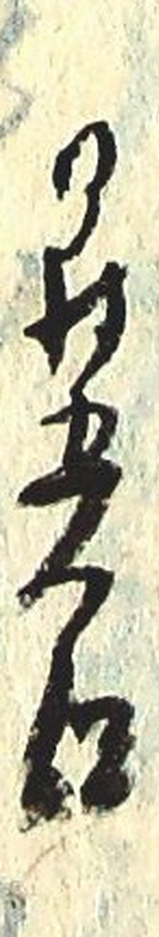同村五人組
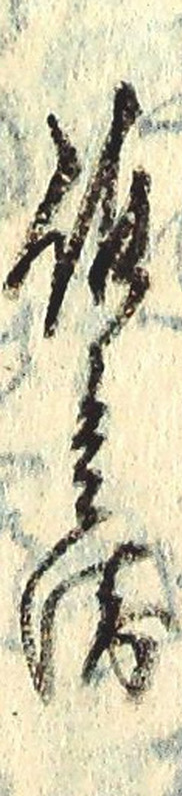同佐兵衛
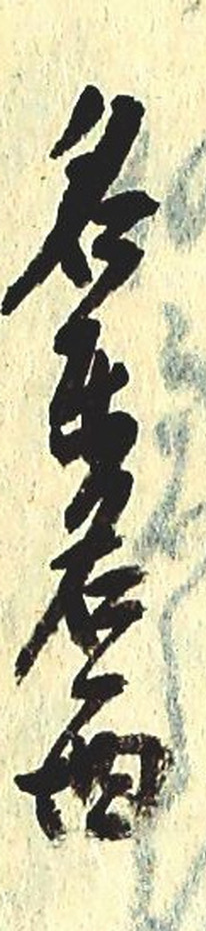名東名西
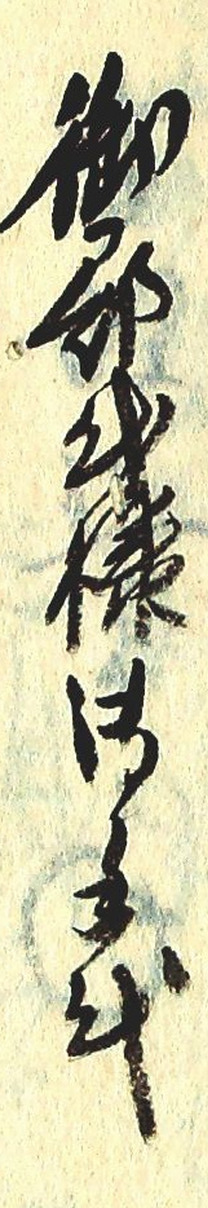御郡代様御手代
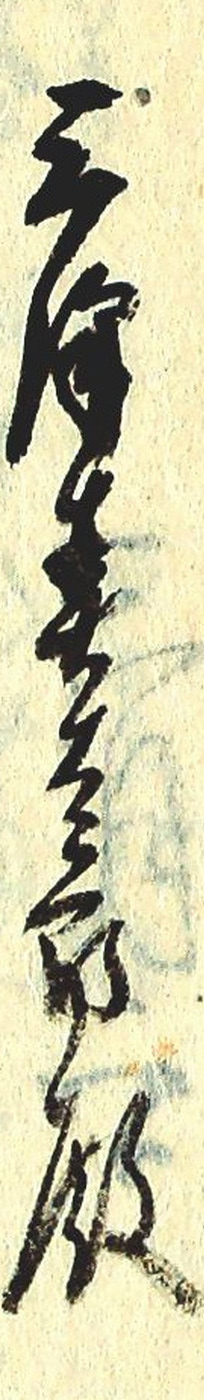三沢春太郎殿
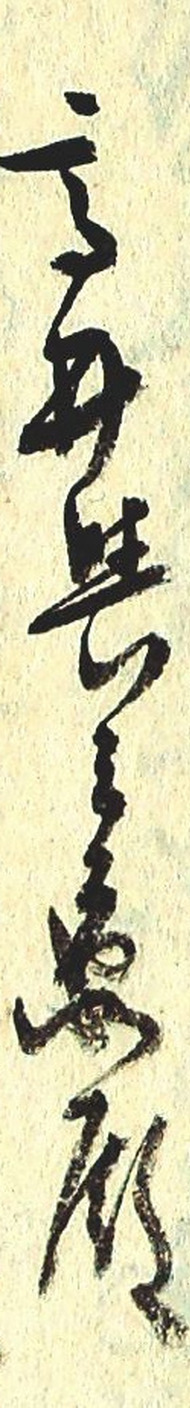高井与三兵衛殿
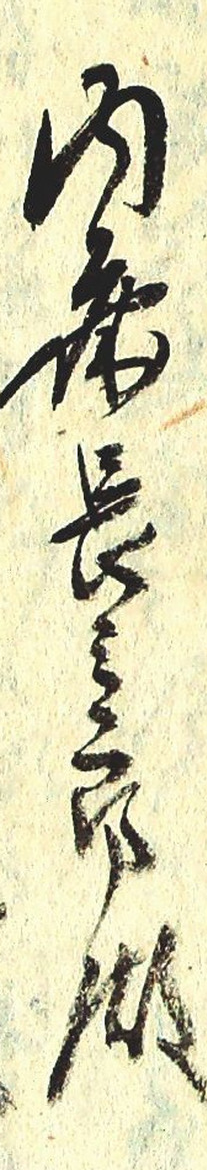内藤長三郎殿
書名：諸御願書控(弐番）
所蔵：鳴門教育大学 Naruto University of Education
